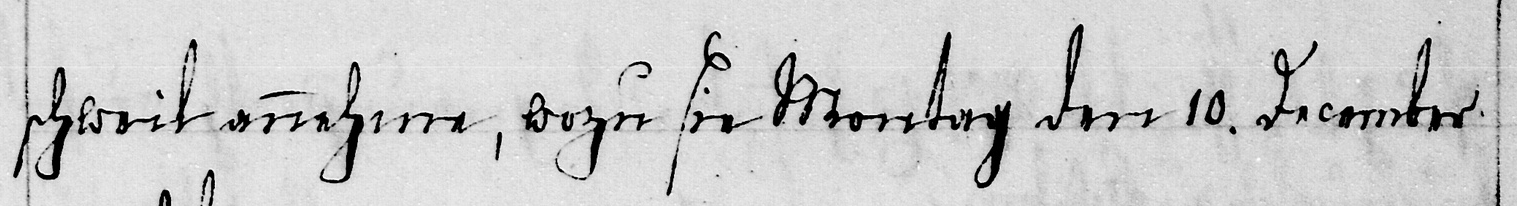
schweil annehme, wozu sie Montag den 10. December
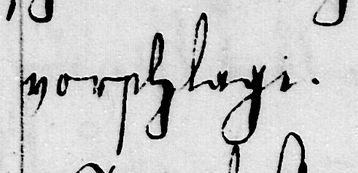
vorschlage.
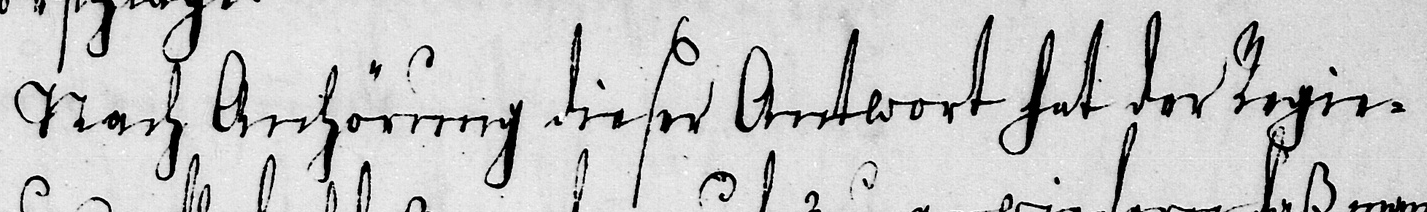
Nach Anhörung dieser Antwort hat der Regie¬
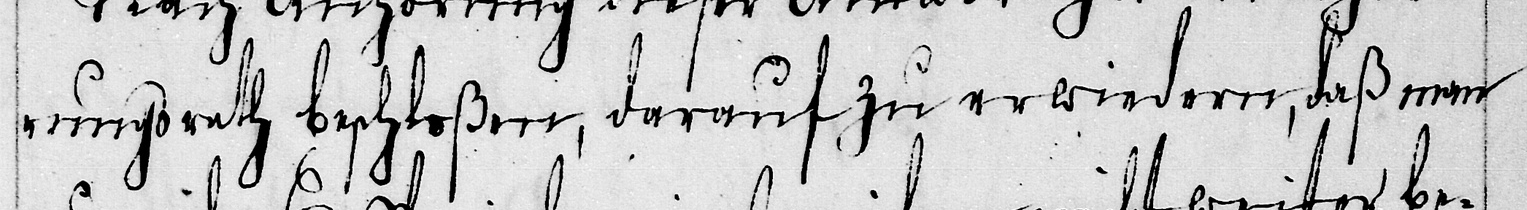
rungsrath beschloßen, darauf zu erwiedern, daß man
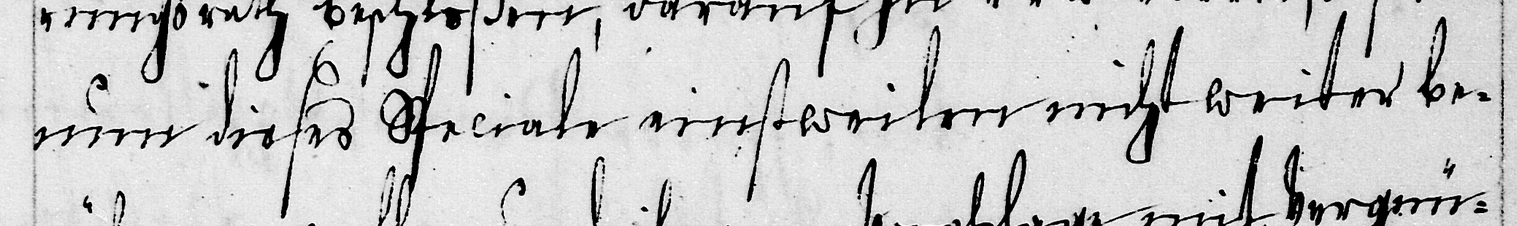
nun dieses Speciale einstweilen nicht weiter be¬
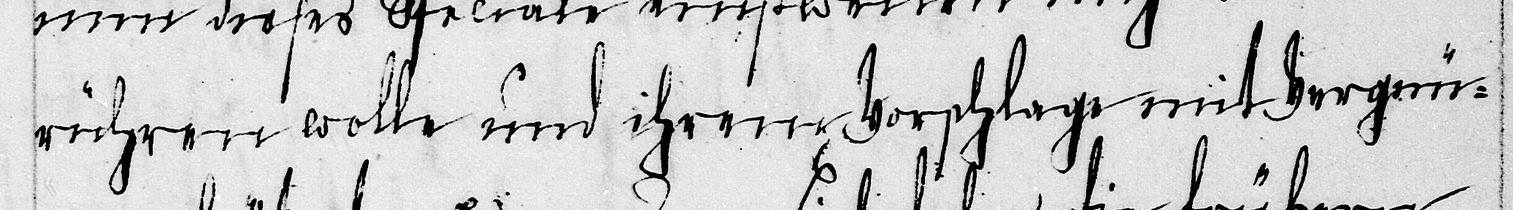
rühren wolle und ihrem Vorschlage mit Vergnü¬
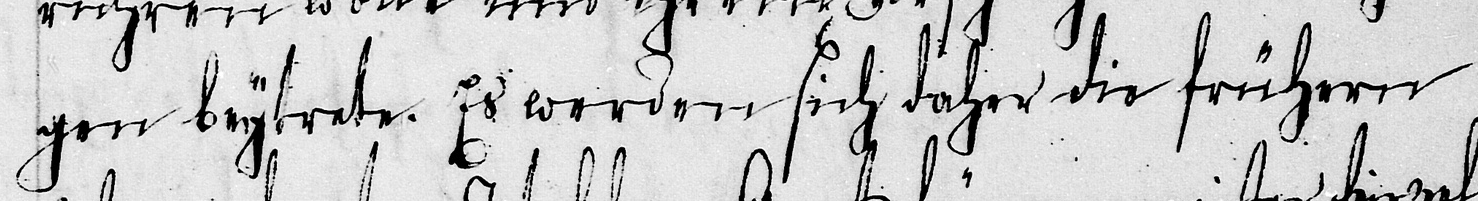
gen beytrete. Es werden sich daher die frühern
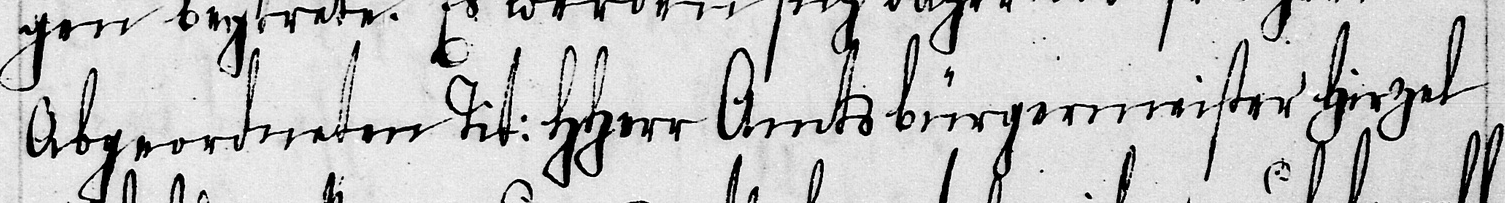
Abgeordneten Tit. HHerr Amtsbürgermeister Hirzel
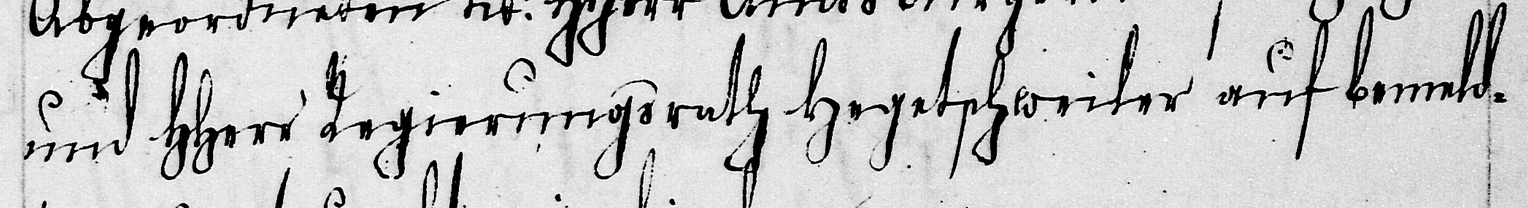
und HHerr Regierungsrath Hegetschweiler auf bemeld¬
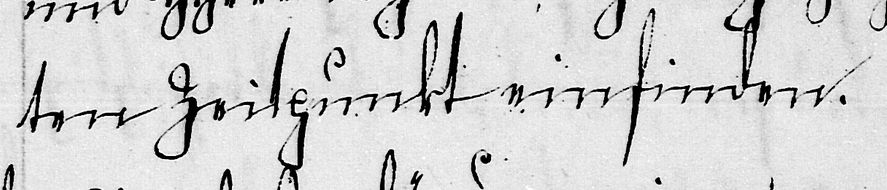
ten Zeitpunkt einfinden.
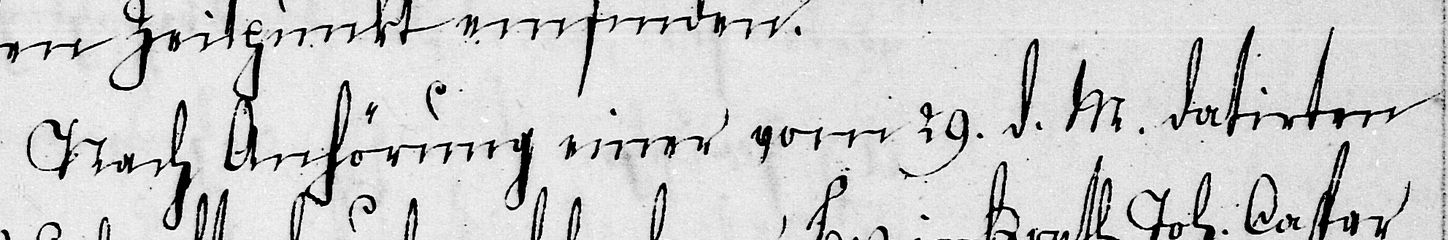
Nach Anhörung einer vom 29. d. M. datirten
